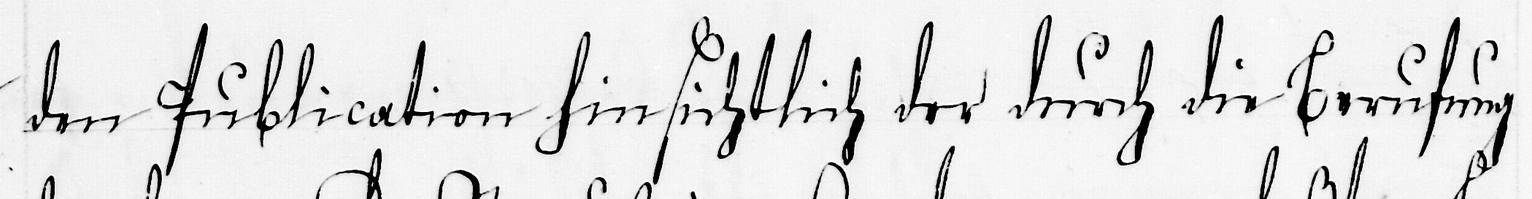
den Publication hinsichtlich der durch die Berufung
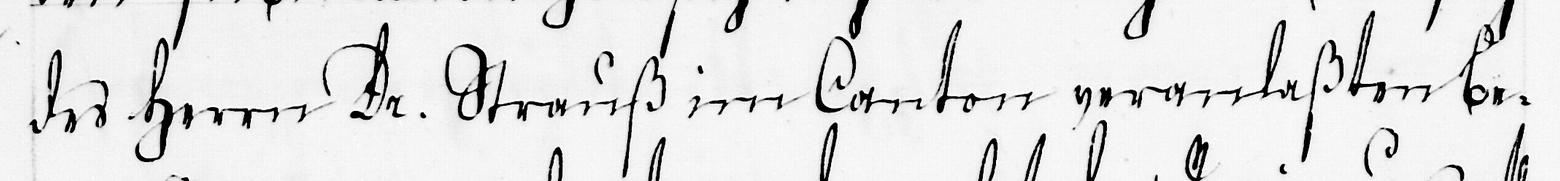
des Herrn Dr. Strauß im Canton veranlaßten Be¬
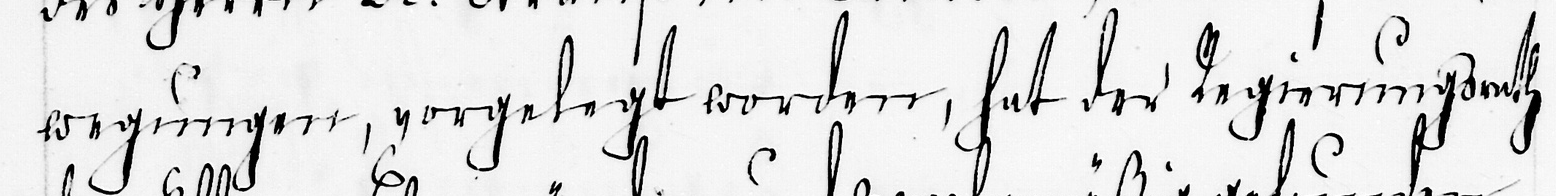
wegungen, vorgelegt worden, hat der Regierungsrath
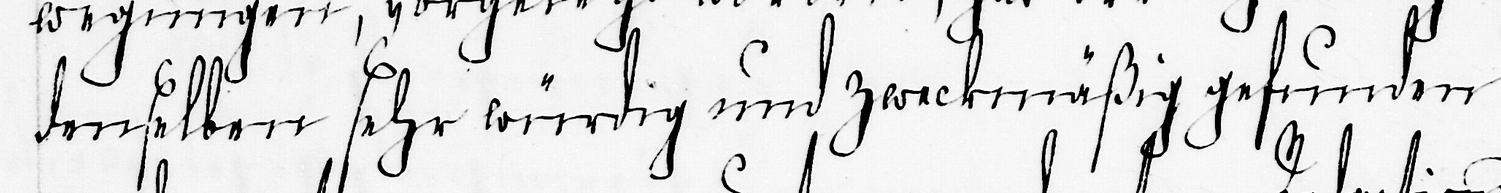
denselben sehr würdig und zweckmäßig gefunden
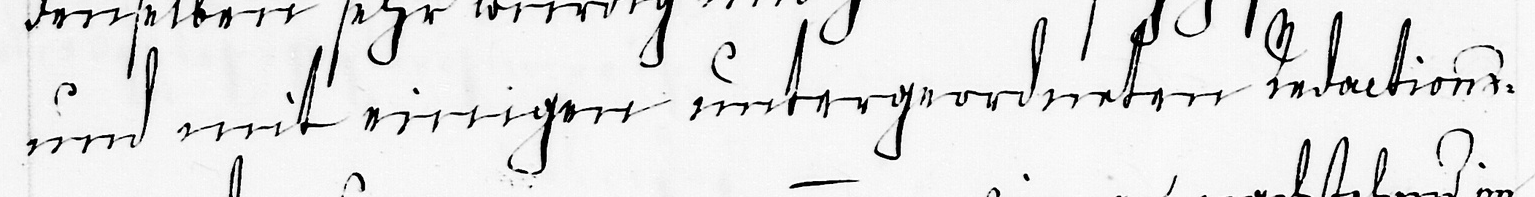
und mit einigen untergeordneten Redactions¬
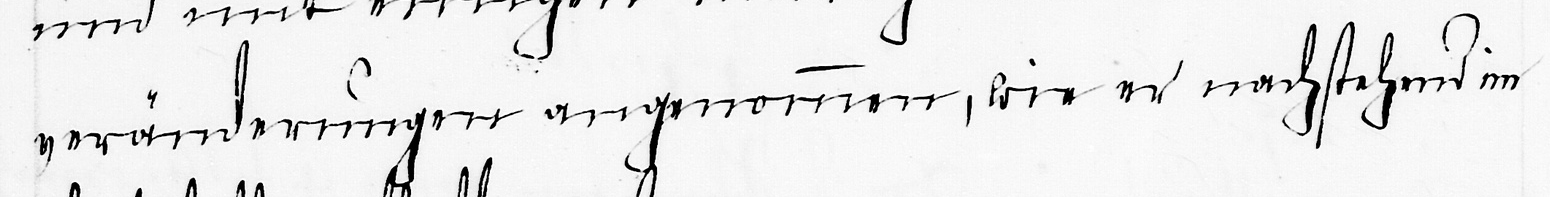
veränderungen angenommen, wie er nachstehend im
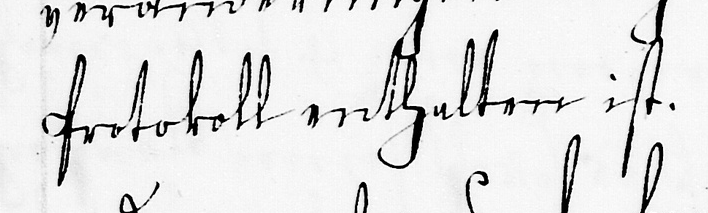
Protokoll enthalten ist.
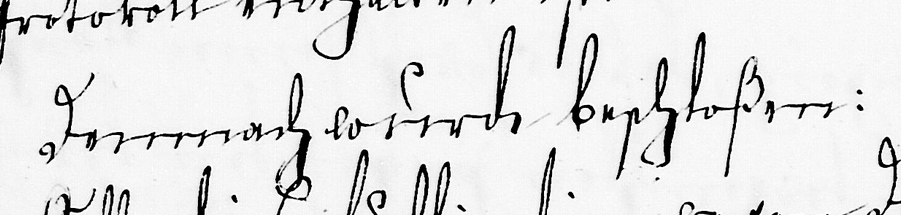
Demnach wurde beschloßen:
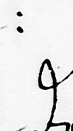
1.)
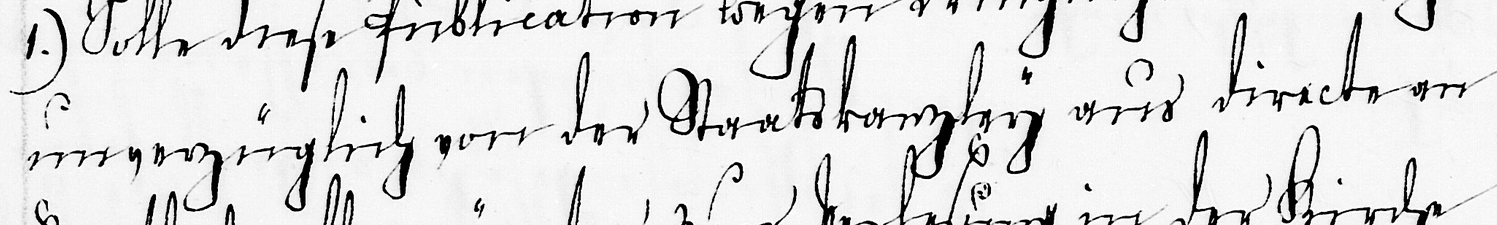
unverzüglich von der Staatskanzley aus directe an
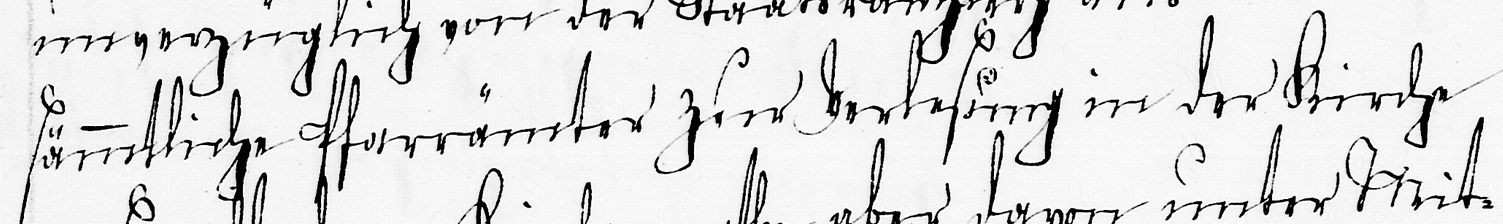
sämmtliche Pfarrämter zur Verlesung in der Kirche
